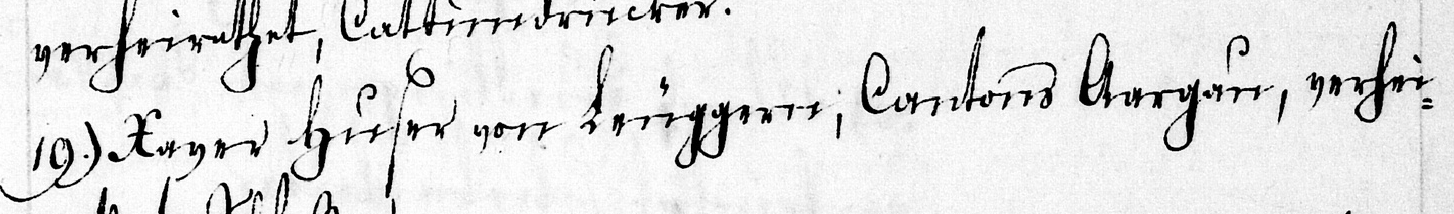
19.) Xaver Huser von Leuggern, Cantons Aargau, verhei¬
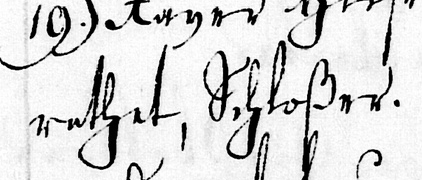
rathet, Schloßer.
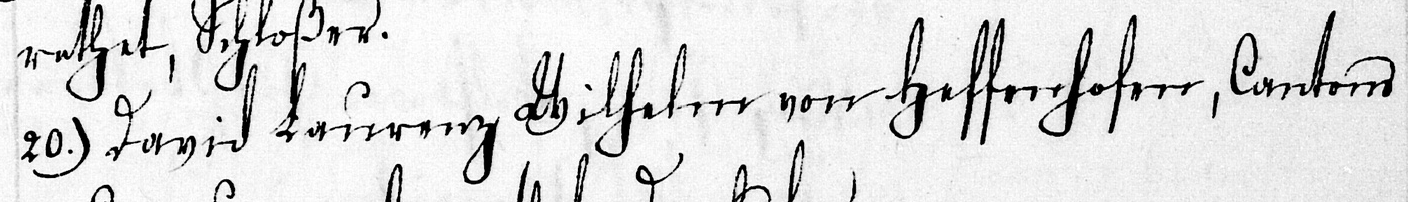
20.) David Laurenz Wilhelm von Heffenhofen, Cantons
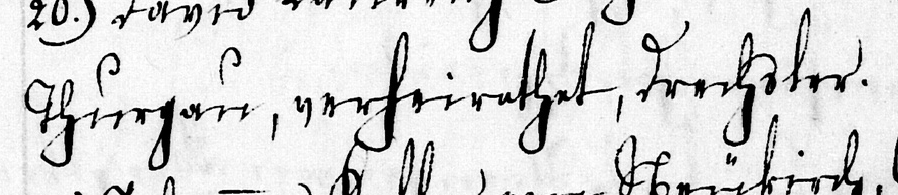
Thurgau, verheirathet, Drechsler.
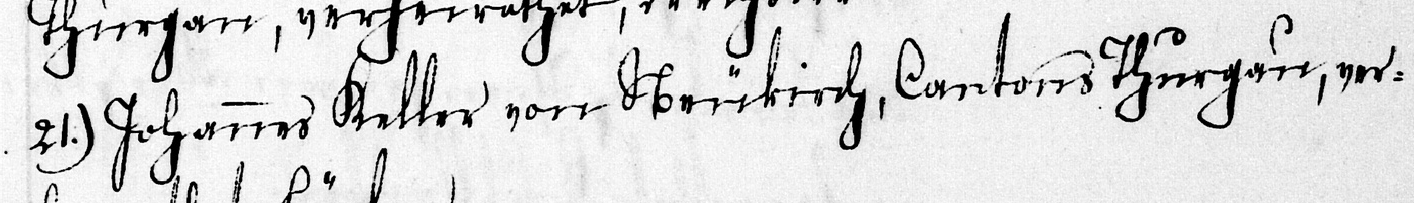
21.) Johannes Keller von Neukirch, Cantons Thurgau, ver¬
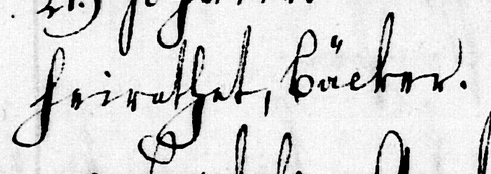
heirathet, Bäcker.
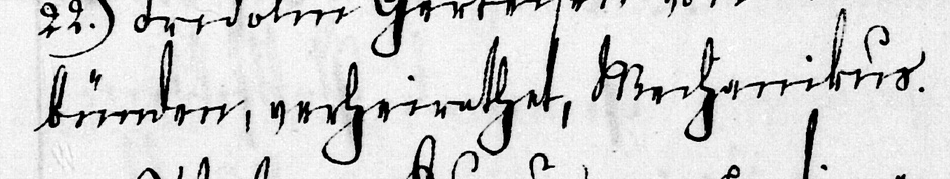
bünden, verheirathet, Mechanikus.
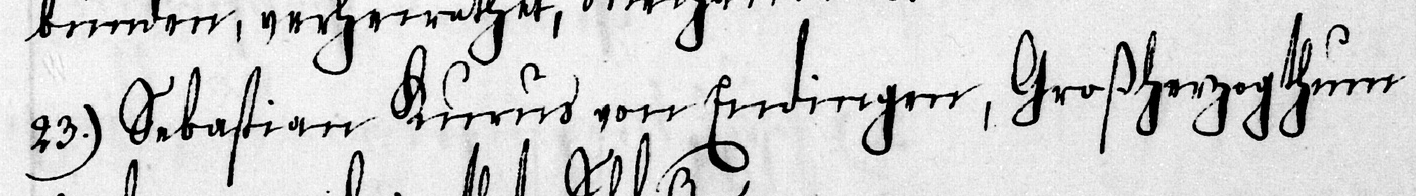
23.) Sebastian Kurus von Endingen, Großherzogthum
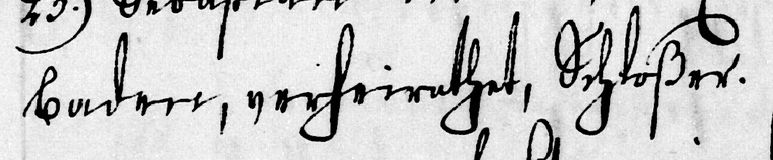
Baden, verheirathet, Schloßer.
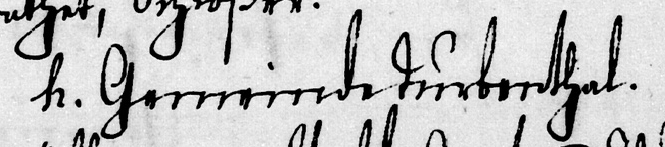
h. Gemeinde Turbenthal.
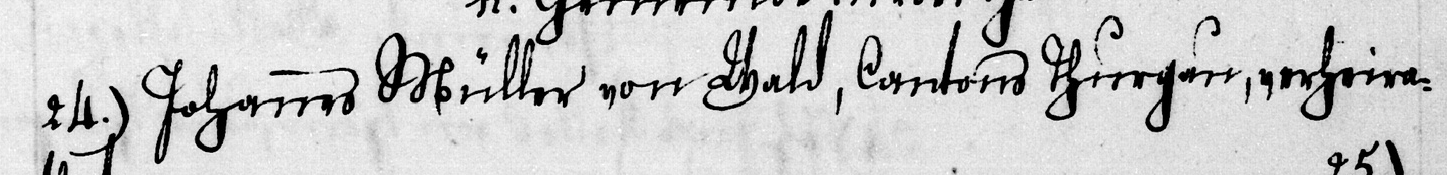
24.) Johannes Müller von Wald, Cantons Thurgau, verheira¬
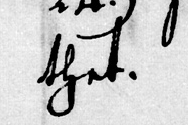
thet.
